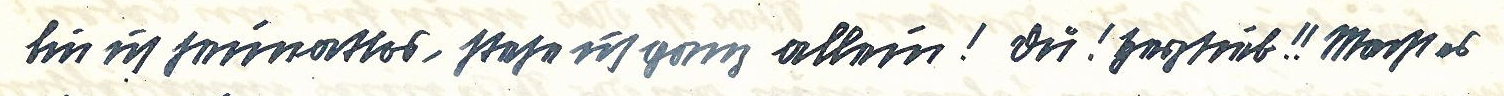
bin ich heimatlos, stehe ich ganz allein! Du! Herzlieb!! Macht es
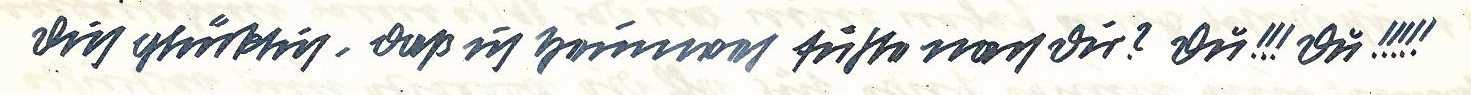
Dich glücklich, dass ich Heimweh fühle nach Dir? Du!!! Du!!!!!
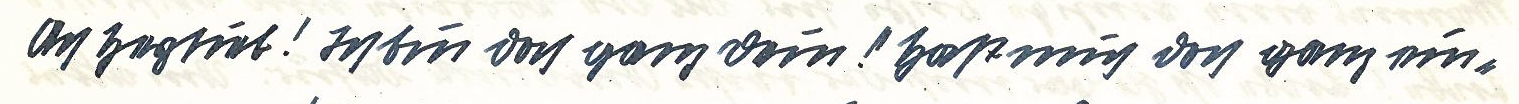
Ach Herzlieb! Ich bin doch ganz Dein!! Hast mich doch ganz ein¬
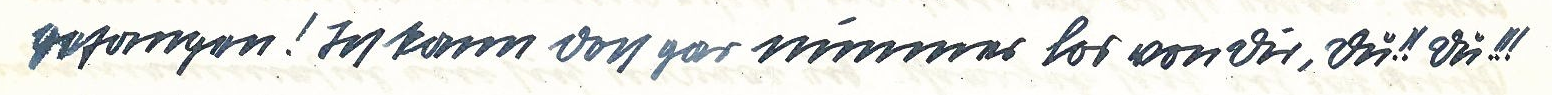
gefangen! Ich kann doch gar nimmer los von Dir, Du!! Du!!!
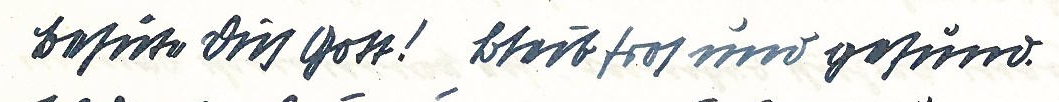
Behüte Dich Gott! Bleib froh und gesund.
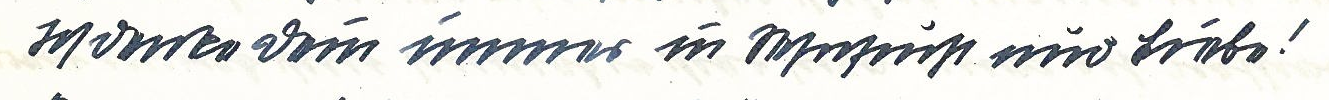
Ich denke Dein immer in Sehnsucht und Liebe!
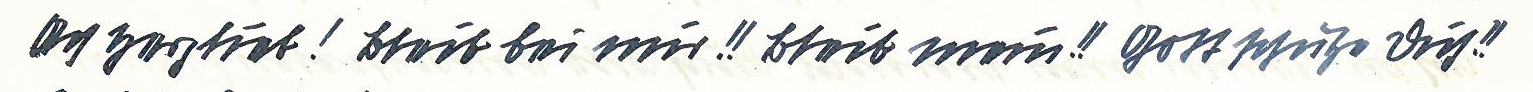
Ach Herzlieb! Bleib bei mir!! Bleib mein!! Gott schütze Dich!!
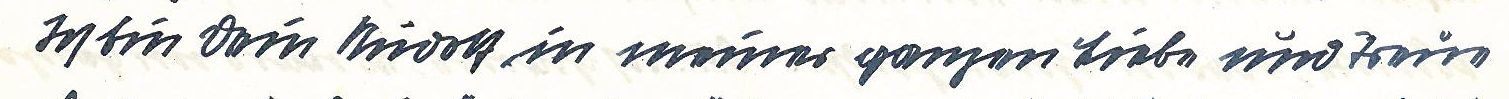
Ich bin Dein in meiner ganzen Liebe und Treue
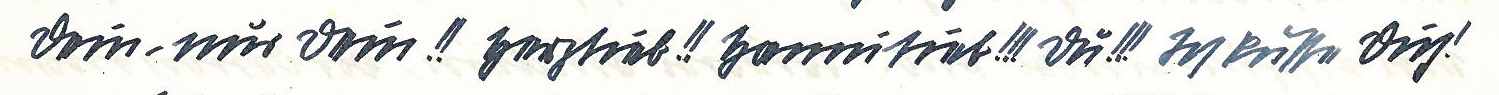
Dein, nur Dein!! Herzlieb!! lieb!!! Du!!! Ich küsse Dich!
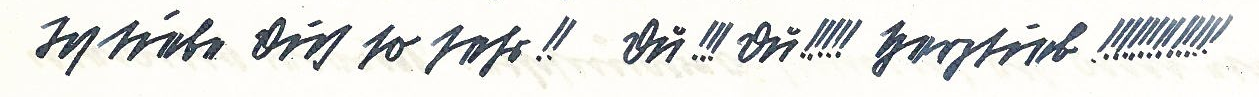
Ich liebe Dich so sehr!! Du!!! Du!!!!! Herzlieb!!!!!!!!!!!!!
